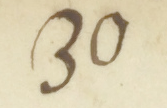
30
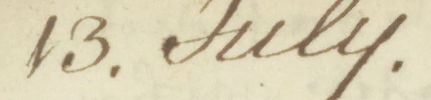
13. July.
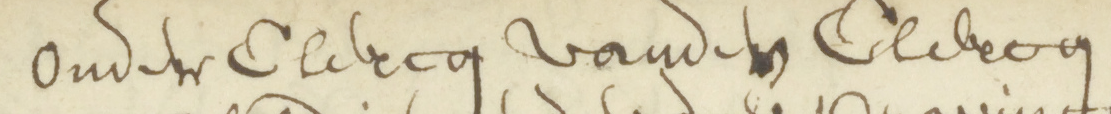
onderClercq vanden Clercq
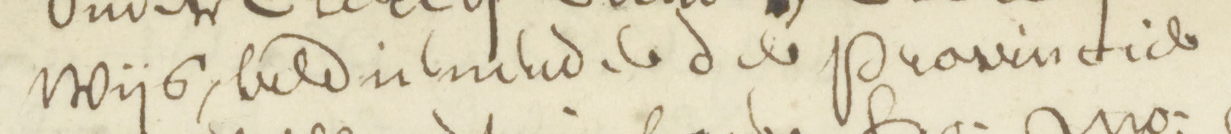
Wijs, bedienende de Provincie
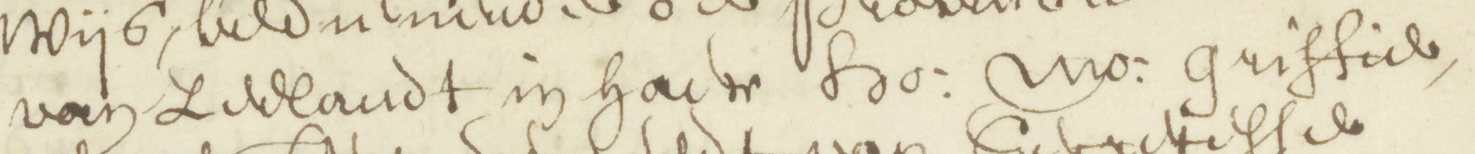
van Zeelandt in haer Ho:Mo: Griffie,
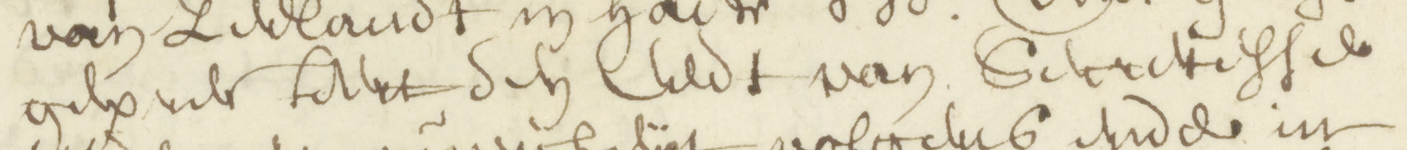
gepresteert den Eedt van Secretesse
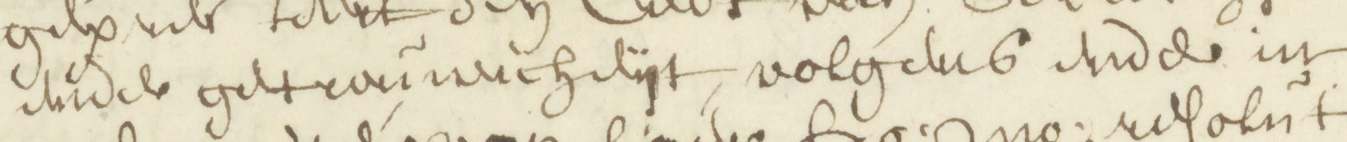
ende getrouwicheijt, volgens ende in
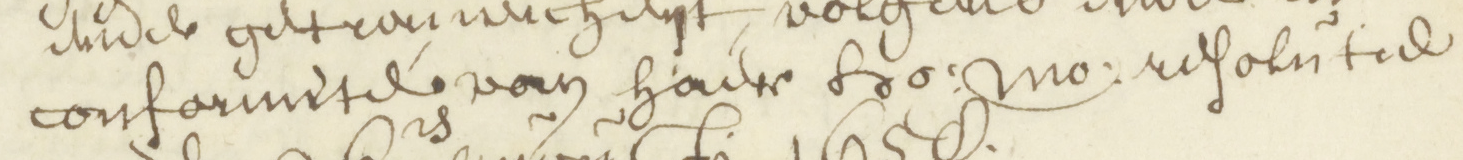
conformité van haer Ho:Mo: resolutie
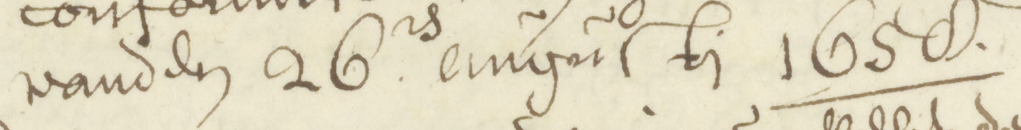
vanden 26en Augusti 1658.
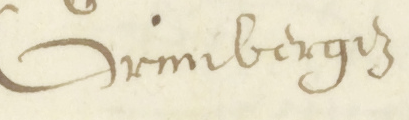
Grimbergen
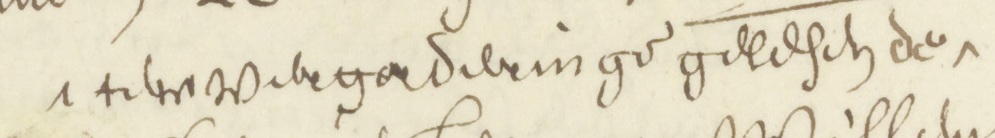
‸ter vergaderinge gelesen de‸
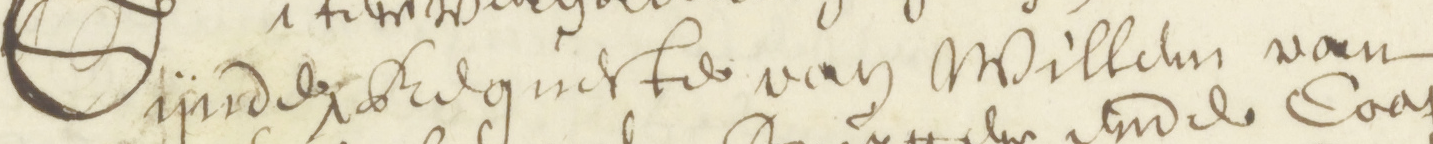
Sijnde‸ Requeste van Willem van
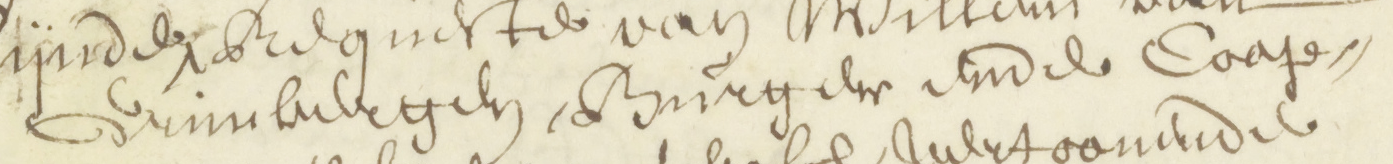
Grimbergen, Burger ende Coop„
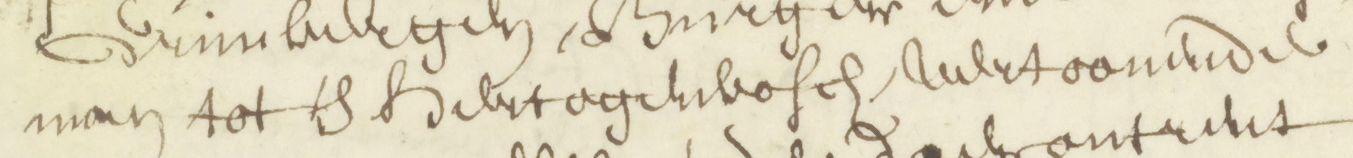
man tot ’s Hertogenbosch, vertoonende
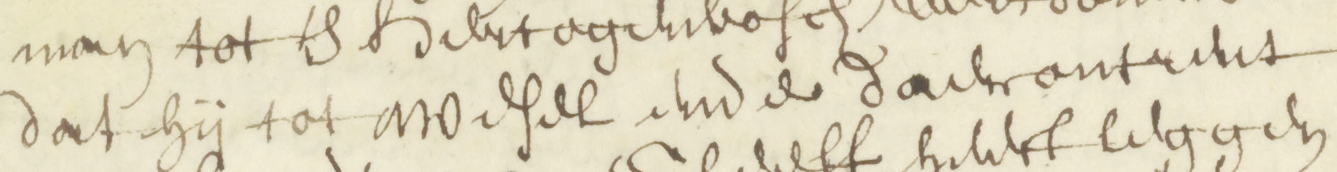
dat hij tot Wesel ende daerontrent
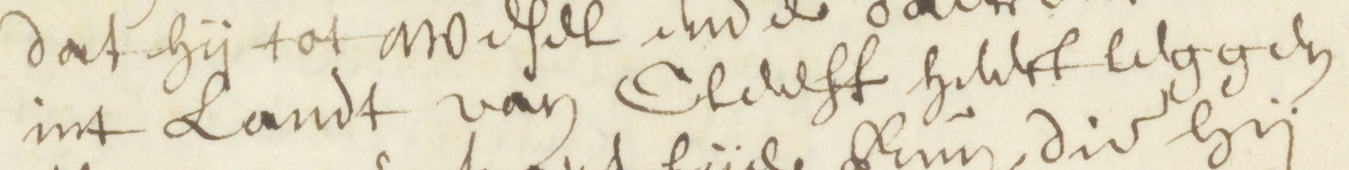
int Landt van Cleeff heeft leggen
